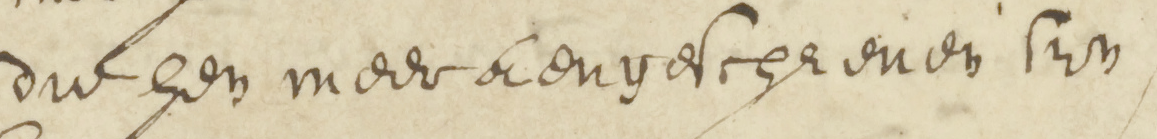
die hen meer aengeschreuen syn.
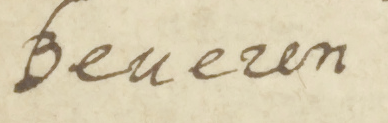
Beueren
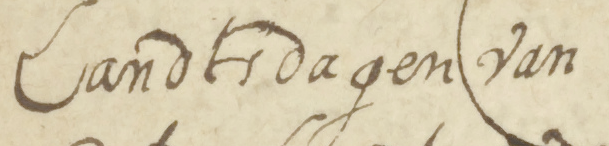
Landtsdagen van
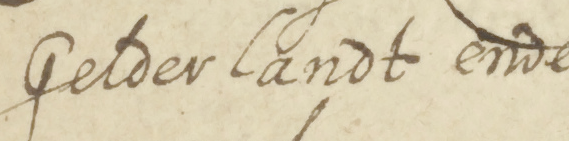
Gelderlandt ende
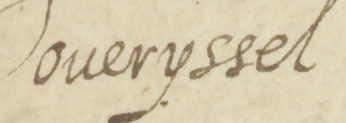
oueryssel
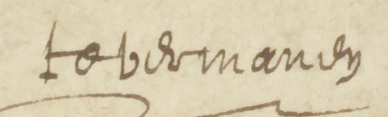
te vermanen
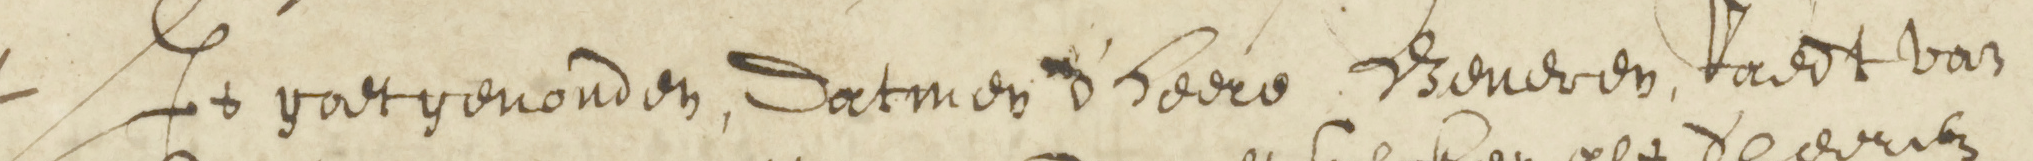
Is goetgeuonden, dat men d'heere Beueren, Raedt van
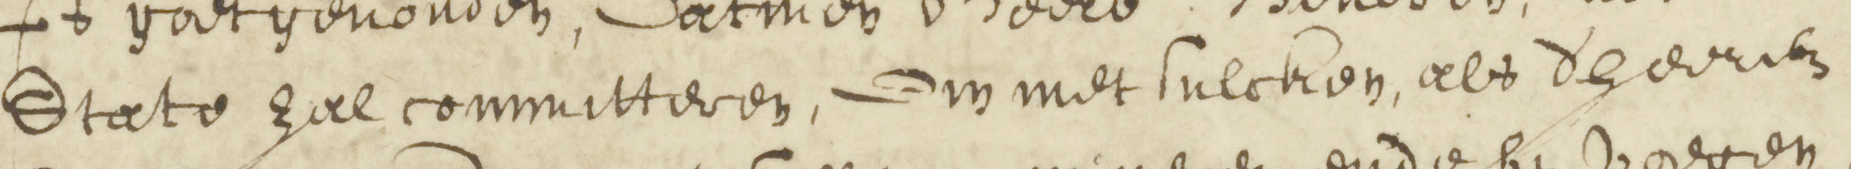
State zal committeren, Om met sulcken, als d'heeren
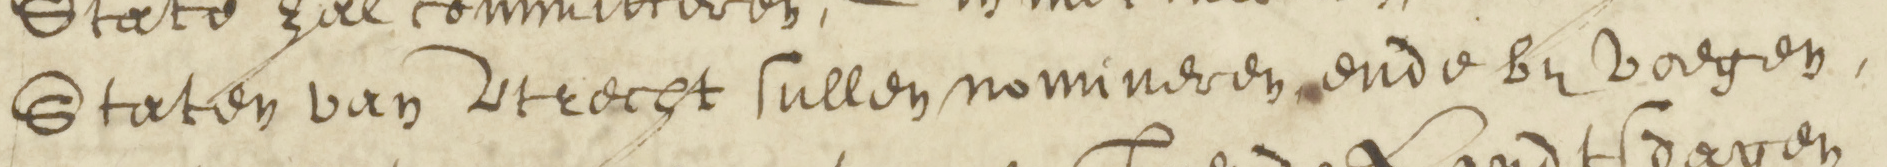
Staten van Utrecht sullen nomineren ende by voegen,
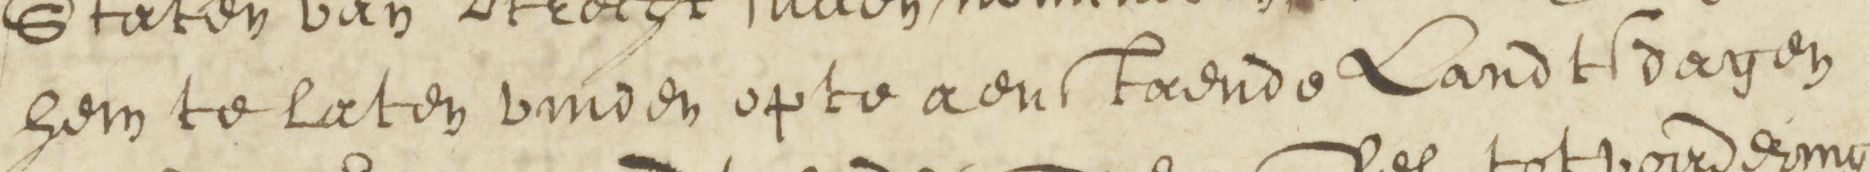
hem te laten vinden opte aenstaende Landtsdagen
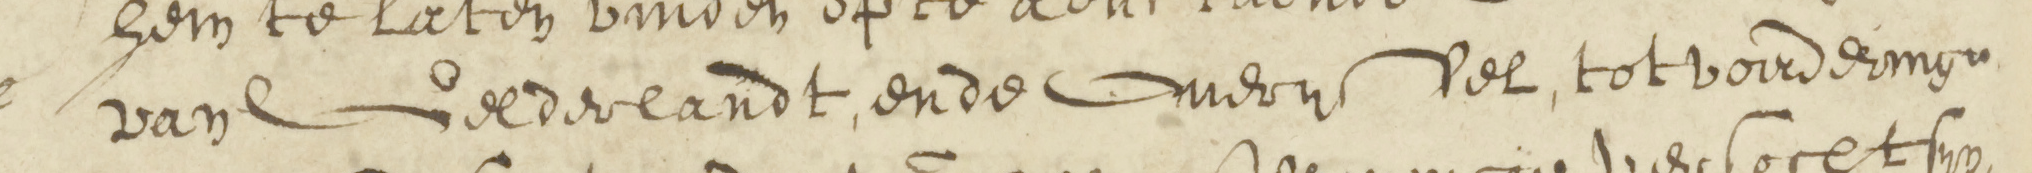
van Gelderlandt, ende Oueryssel, tot voirderinge
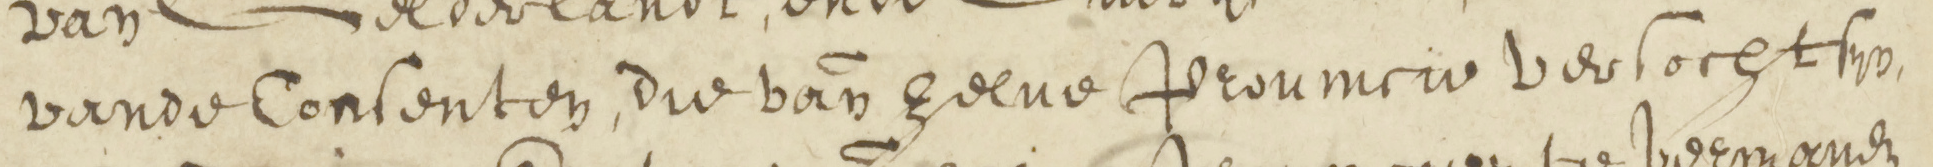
vande Consenten, die van zelue Prouincie versocht syn,
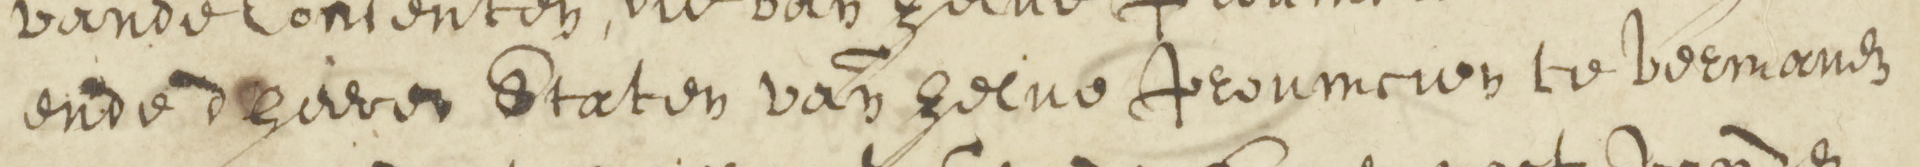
ende d'heeren Staten van zelue Prouincien te vermanen
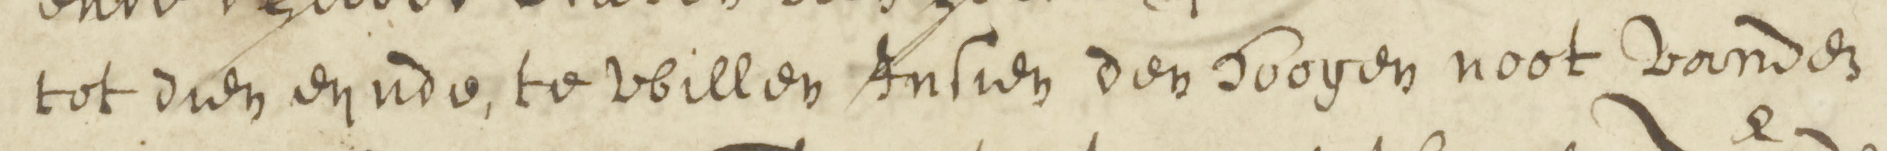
tot dien eynde, te willen insien den hoogen noot vanden
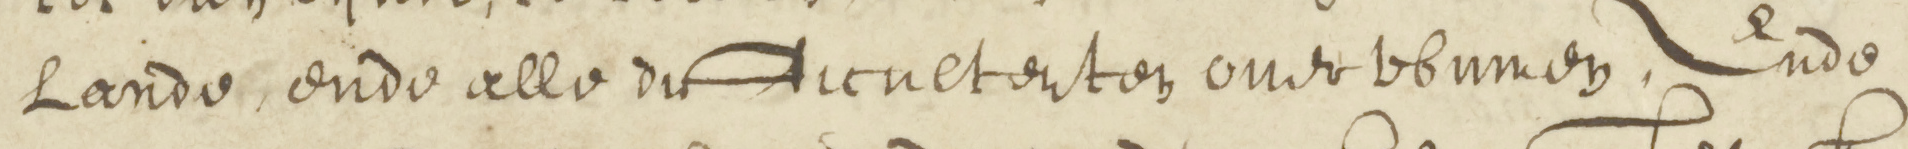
lande, ende alle difficulteyten ouerwinnen, Ende
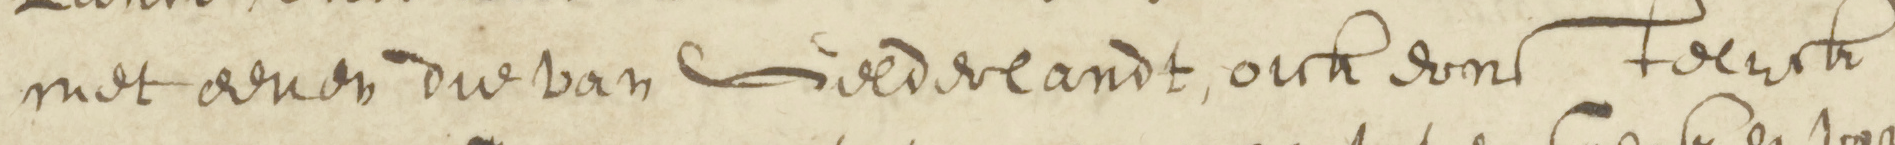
met eenen die van Gelderlandt, oick ernstelyck
